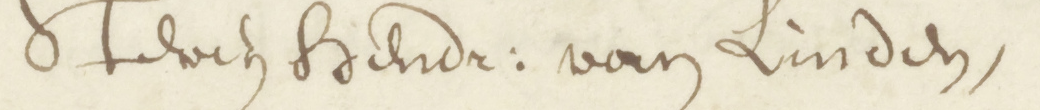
Steven Hendr: van Linden,
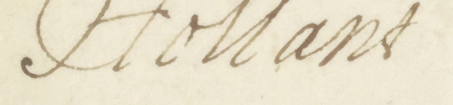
Hollant
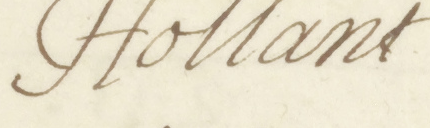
Hollant
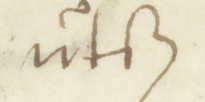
uts
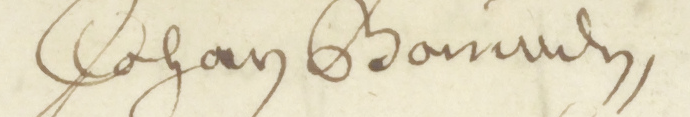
Johan Bouwen.
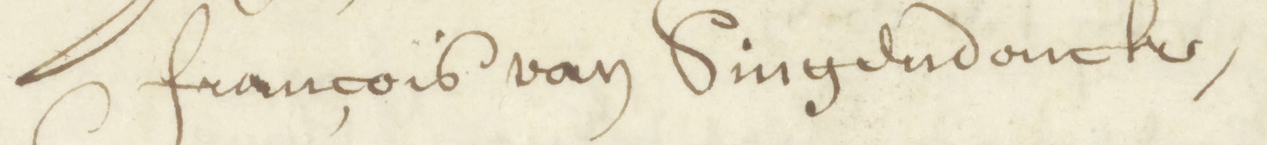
Francois van Singendonck,
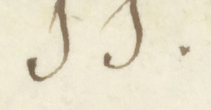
11.
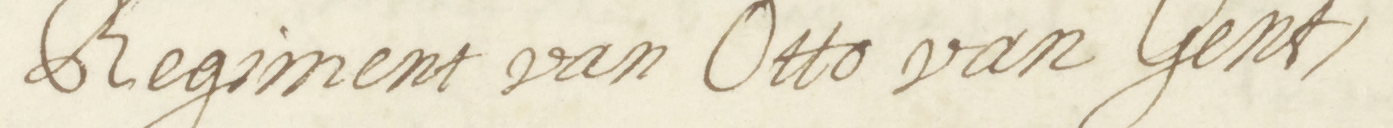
Regiment van Otto van Gent,
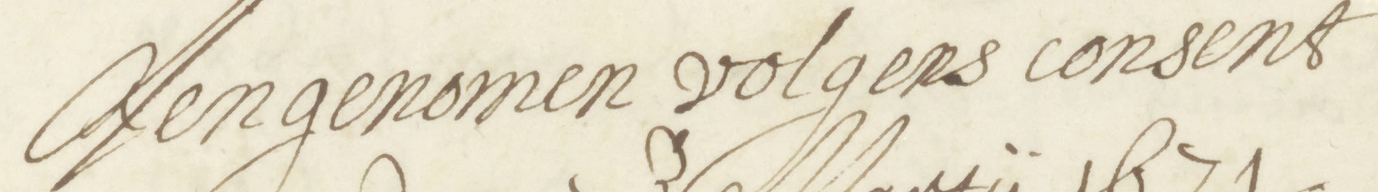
Aengenomen volgens consent
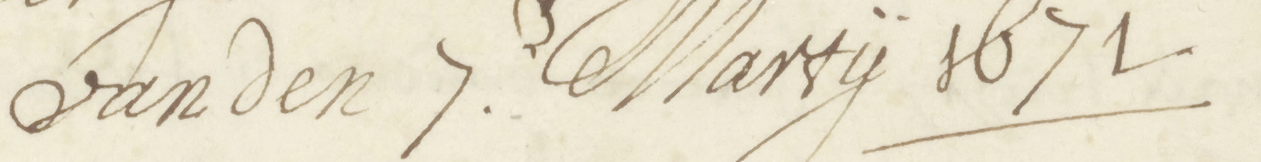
van den 7en Martij 1671
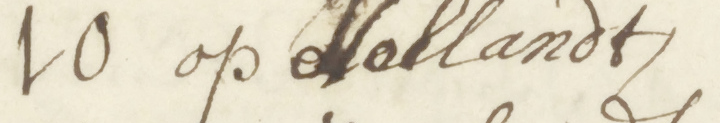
10 op Hollandt,
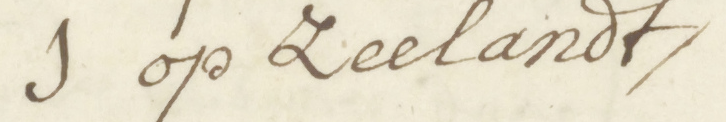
1 op Zeelandt.
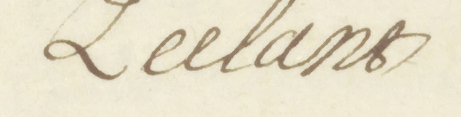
Zeelant
